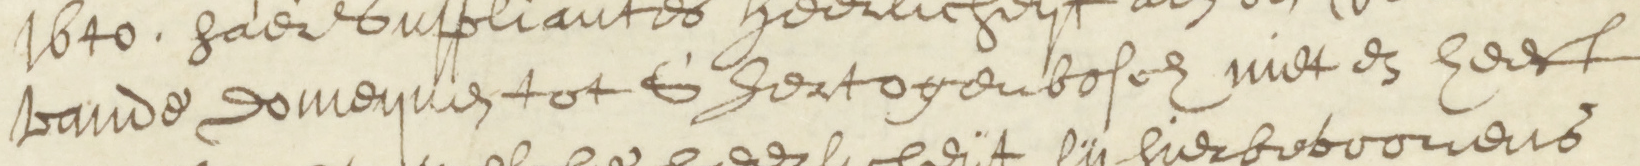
vande Domeynen tot S‛hertogenbosch niet en heeft
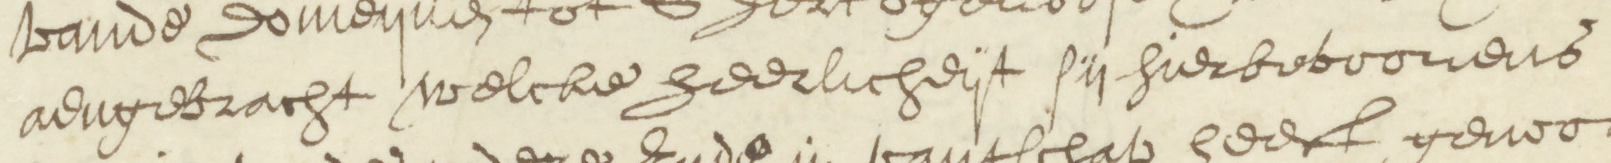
aengebracht welcke heerlicheijt sij hierbevoorens
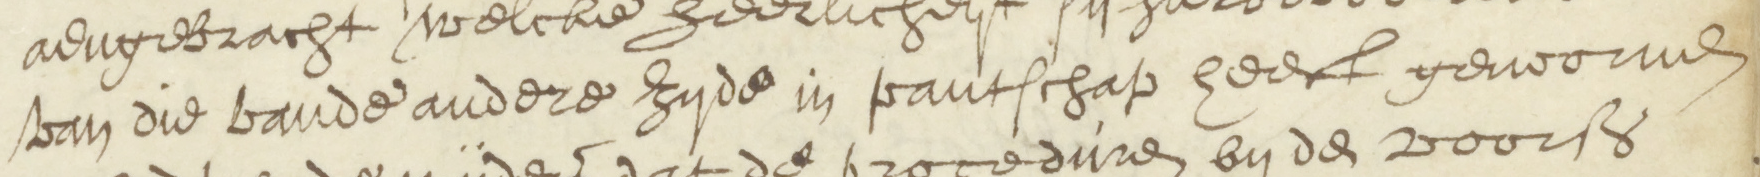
van die vande andere zyde in pantschap heeft genoomen
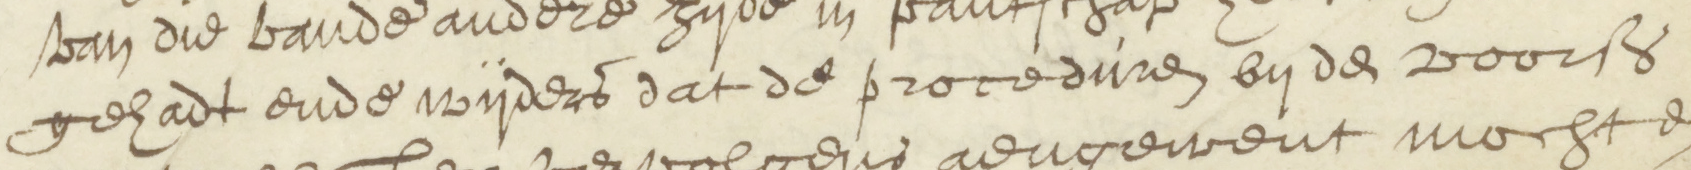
gehadt ende wijders dat de proceduren by den voors
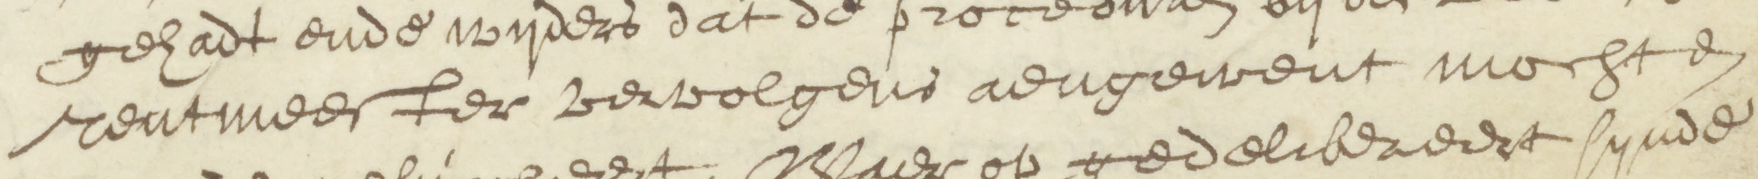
rentmeester vervolgens aengewent mochten
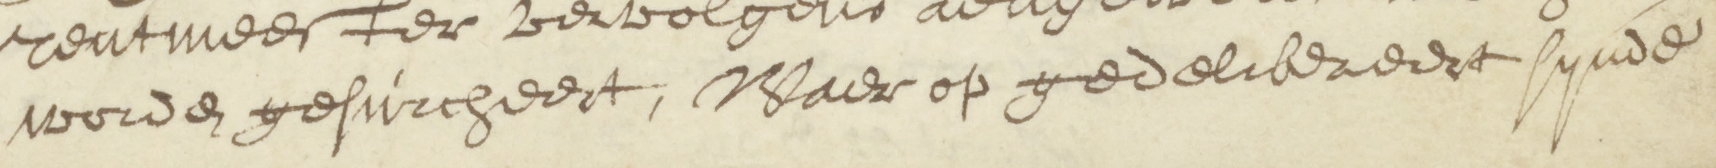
worden gesurcheert; Waer op gedelibereert synde,
